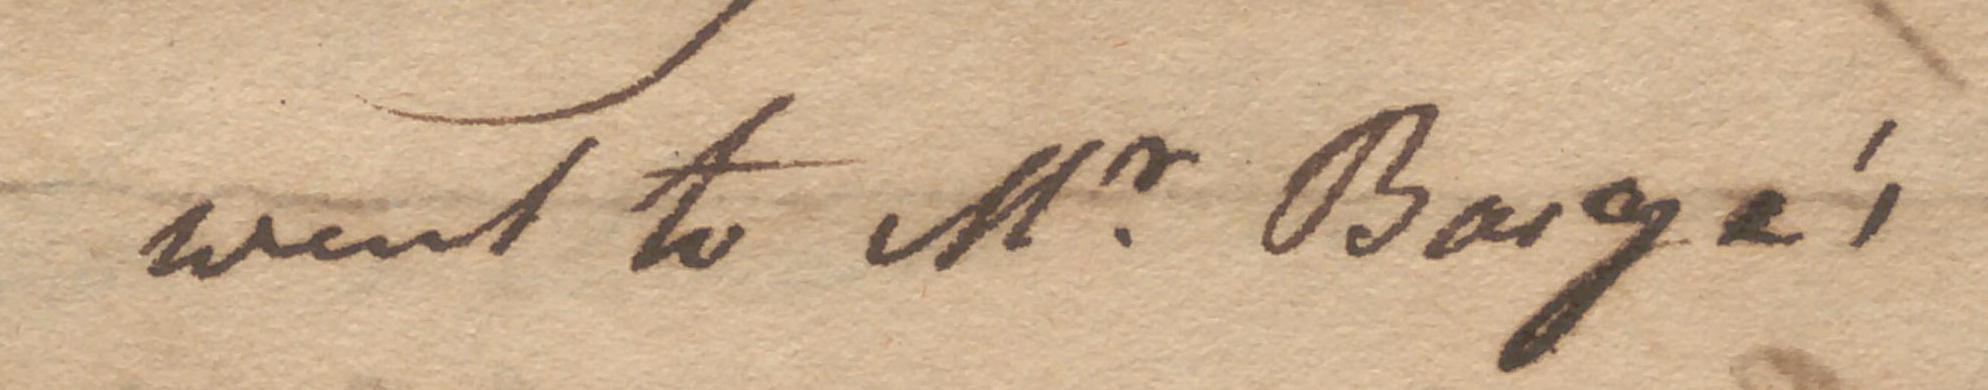went to M^r. Barge's
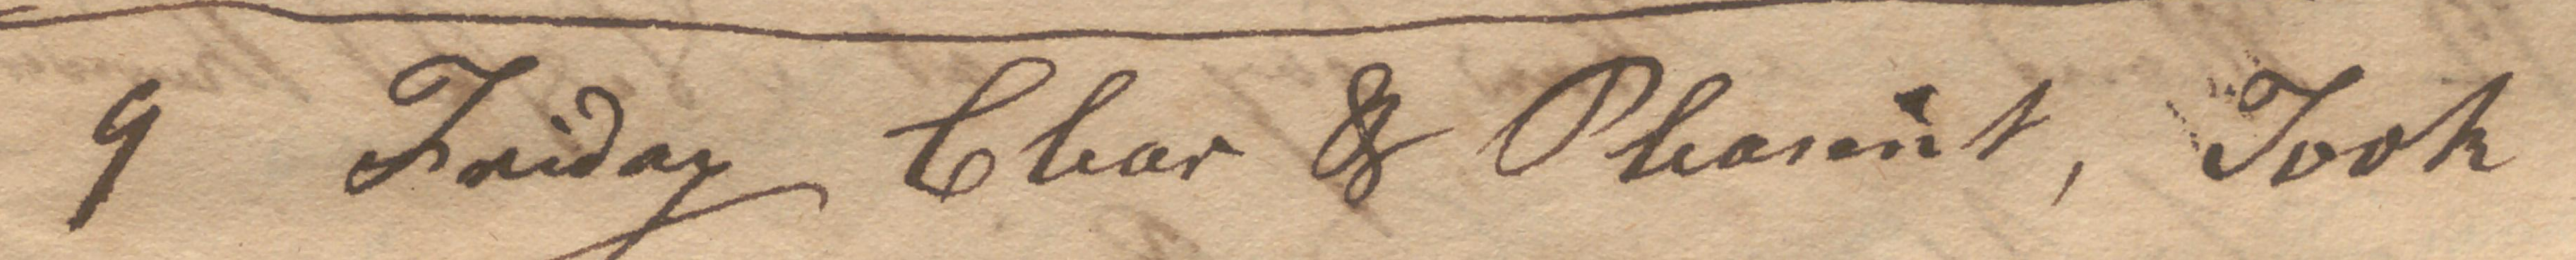9 Friday Clear & Pleasent, Took
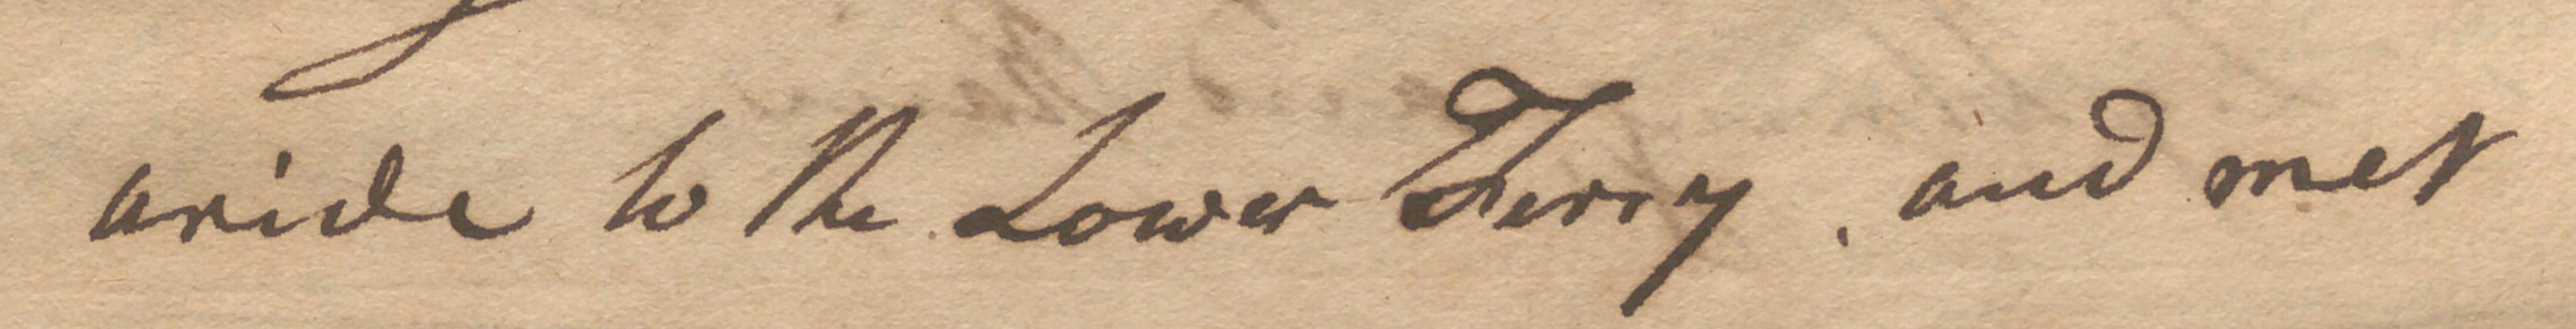a ride to the Lower Ferry and met
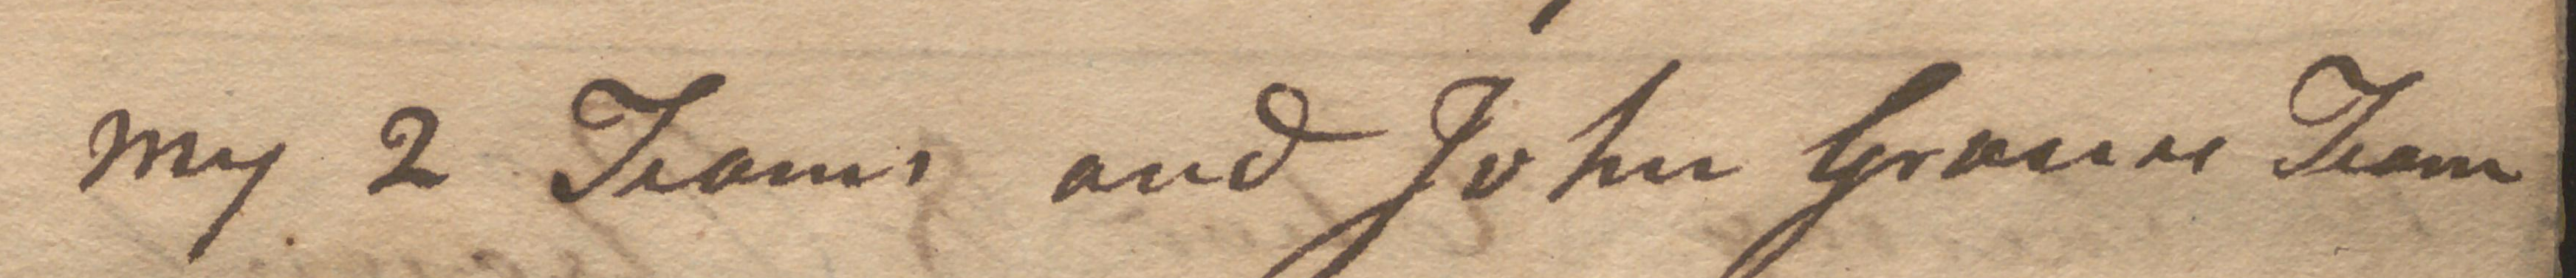my 2 Teams and John Graves Team
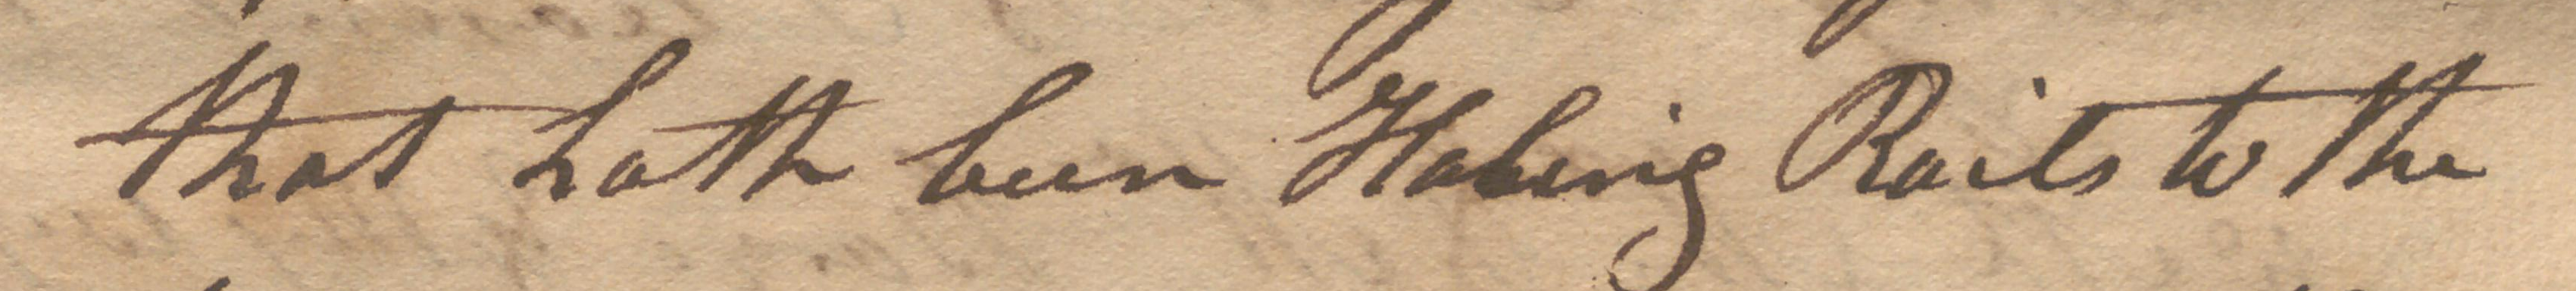that hath been Haling Rails to the
